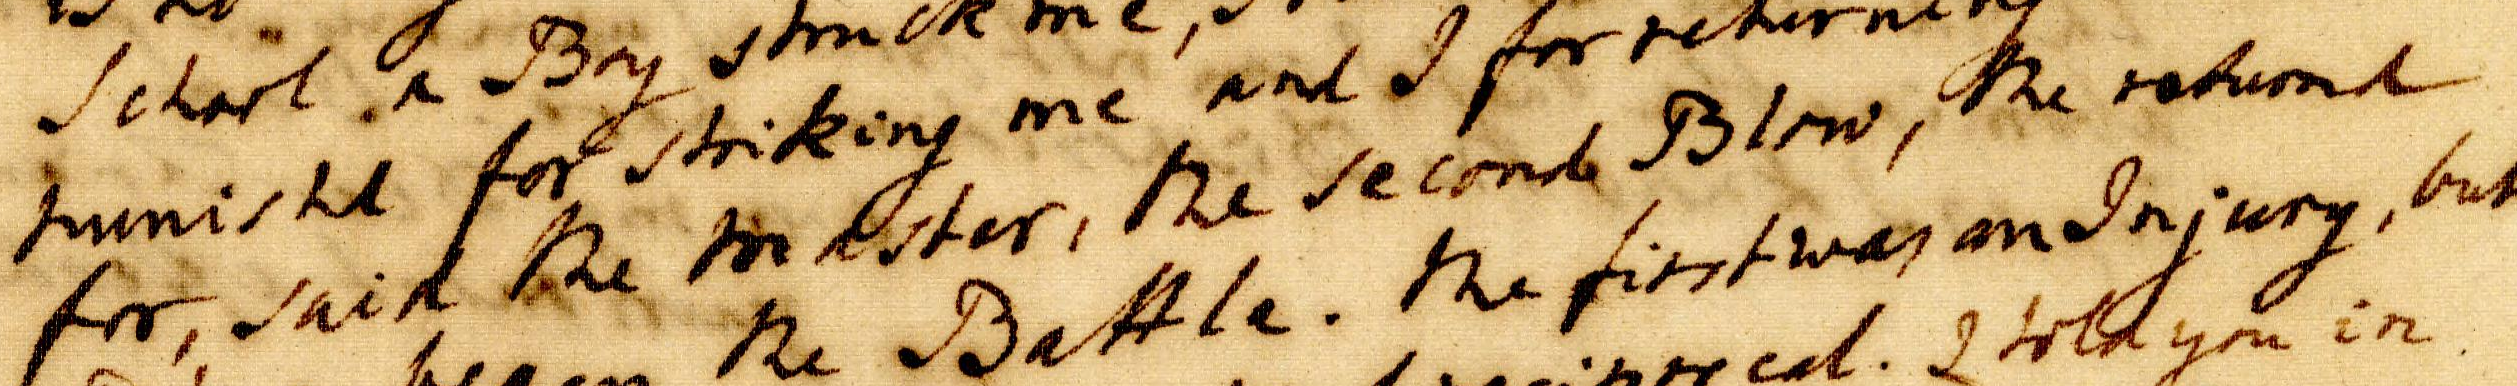for, said the master, the second Blow, the returnd
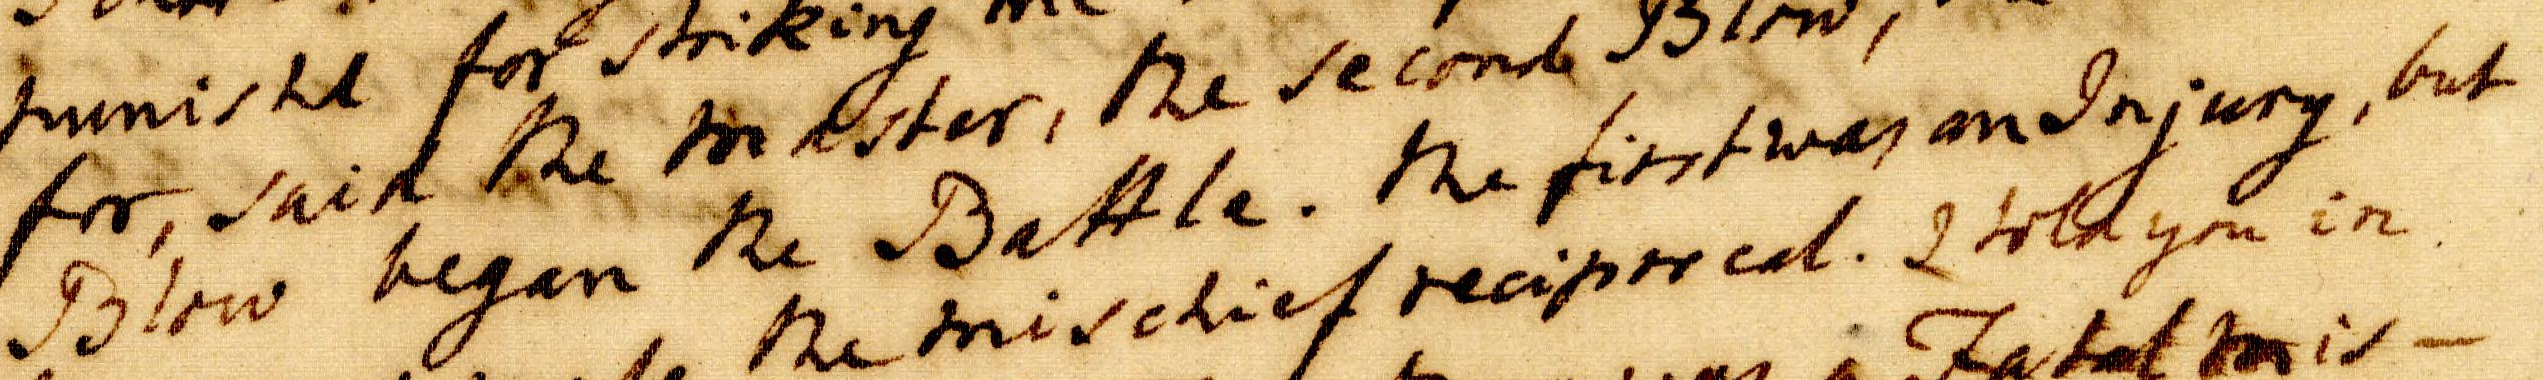Blow began the Battle. the first was an Injury, but
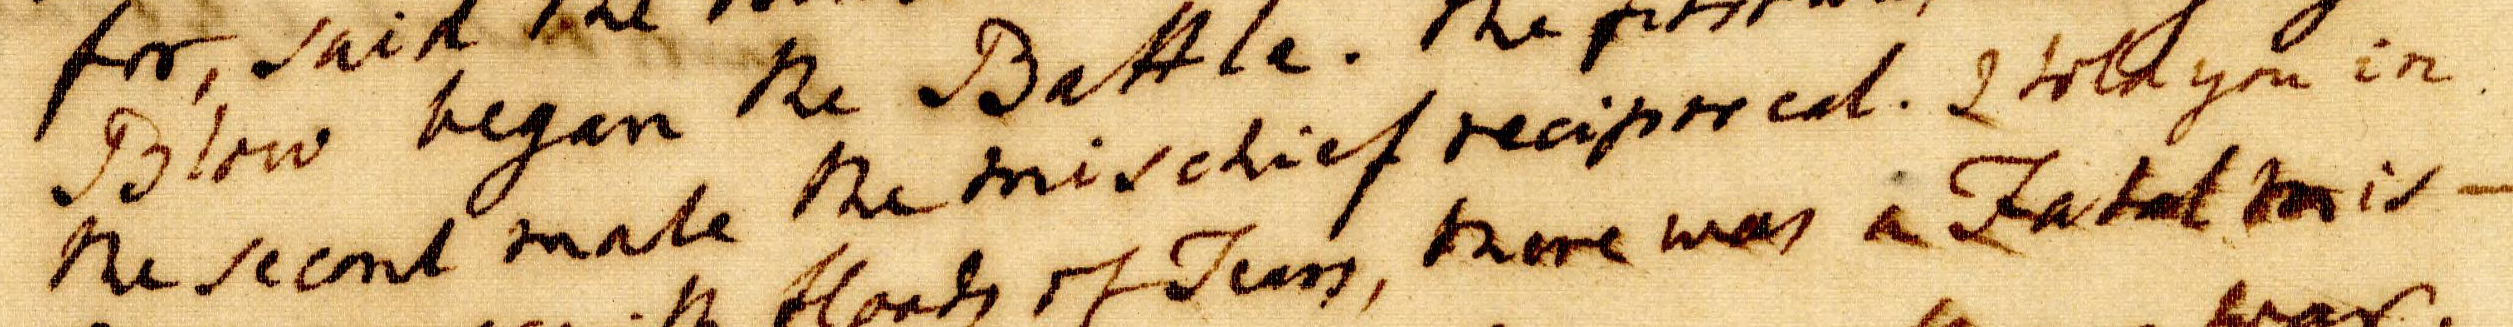the second made the Mischief reciprocal. I told you in
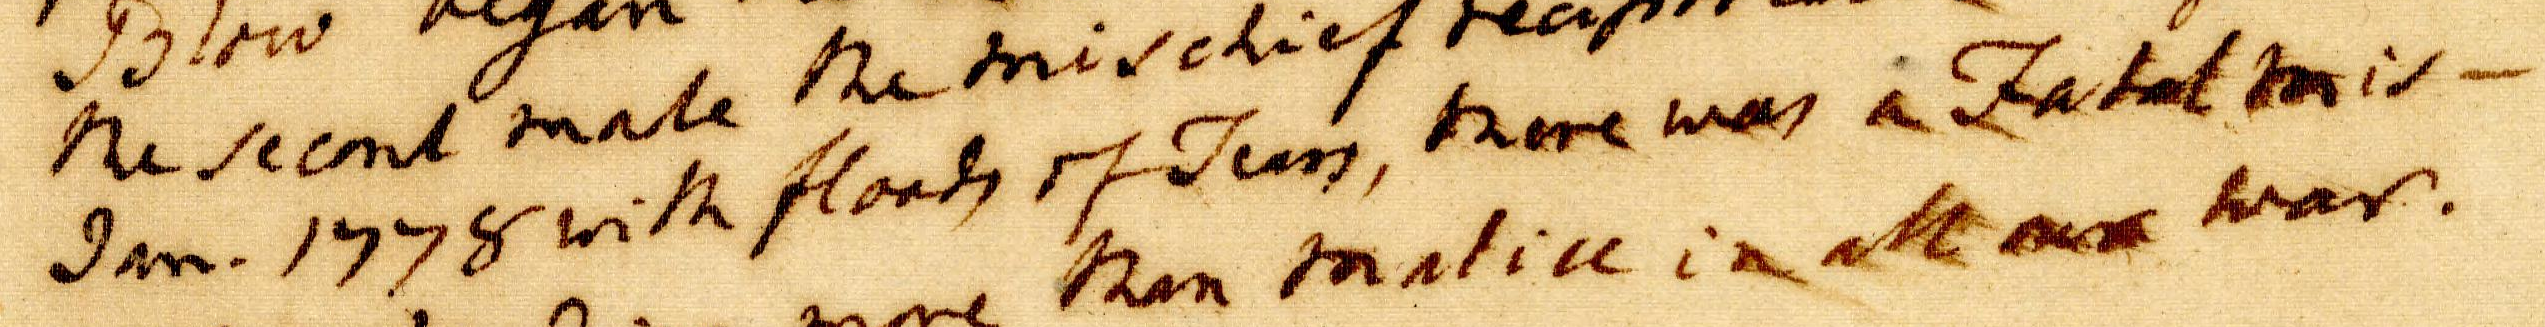Jan. 1778 with floods of Tears, there was a Fatal mis-
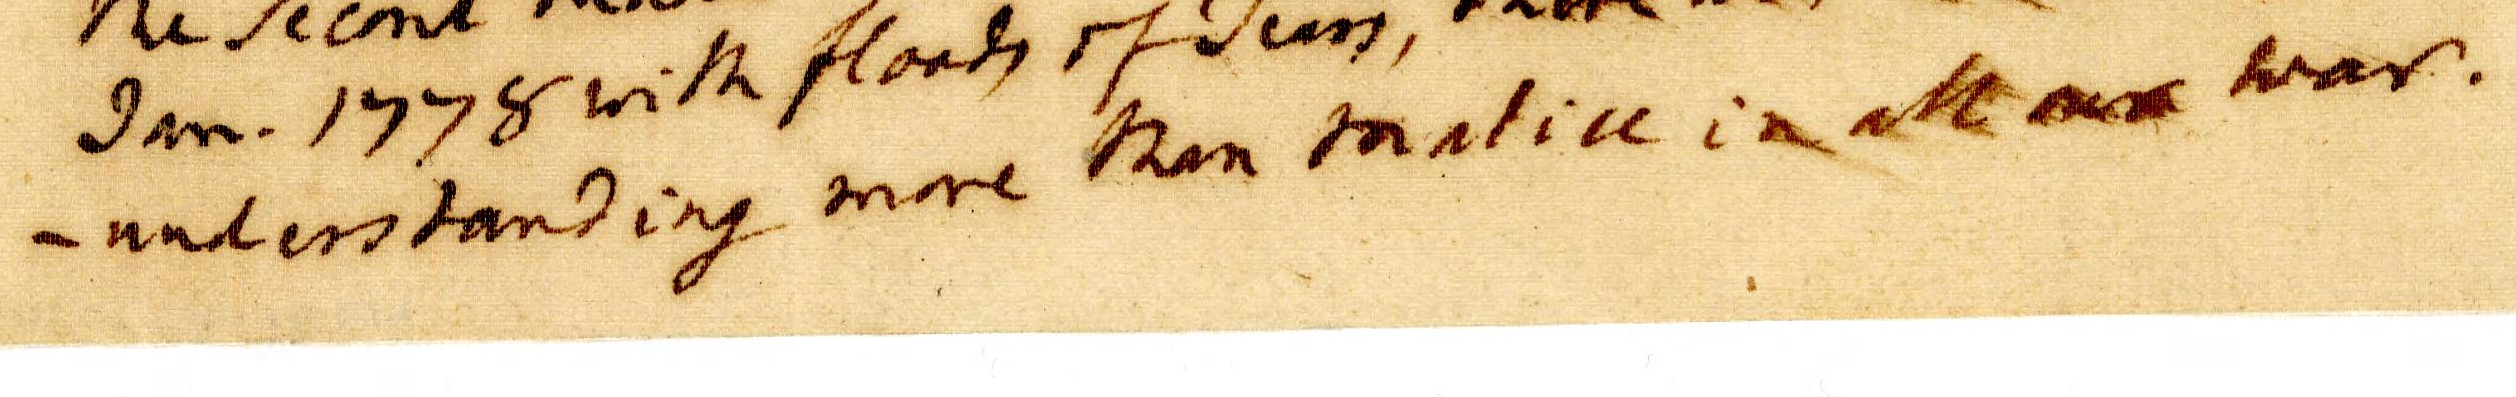-understanding more than malice in all our War.
